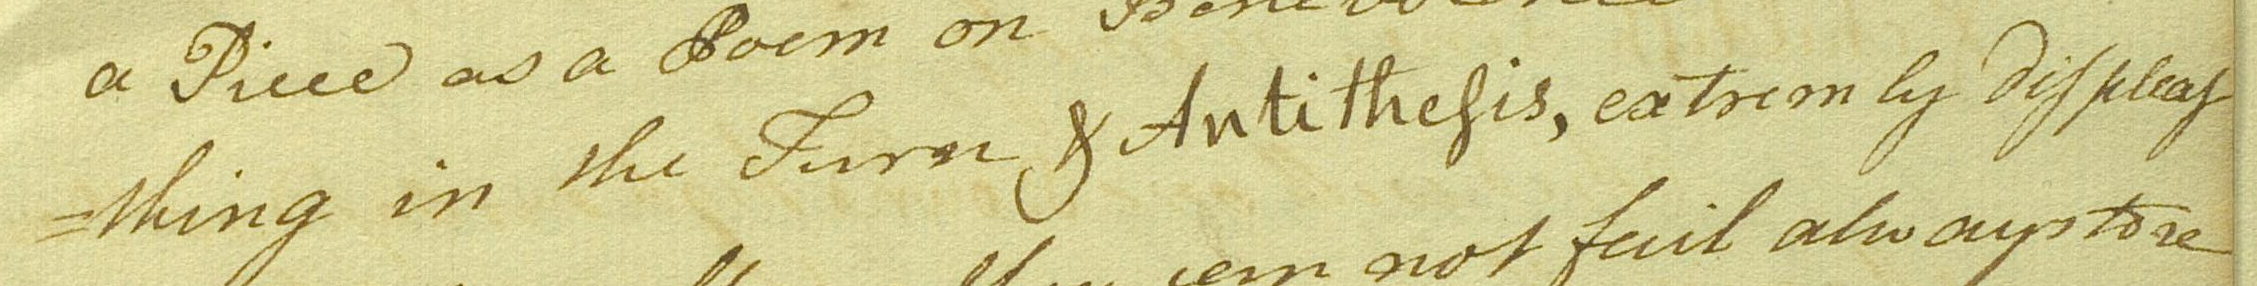-thing in the Form & Antithesis, extremely displeas
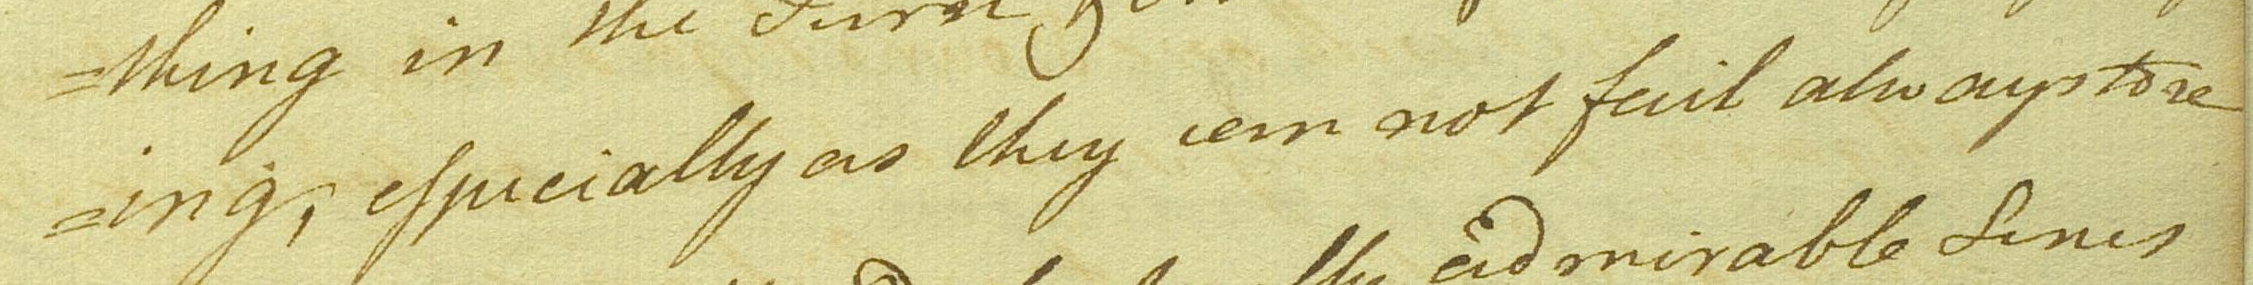-ing, especially as they can not fail always to re
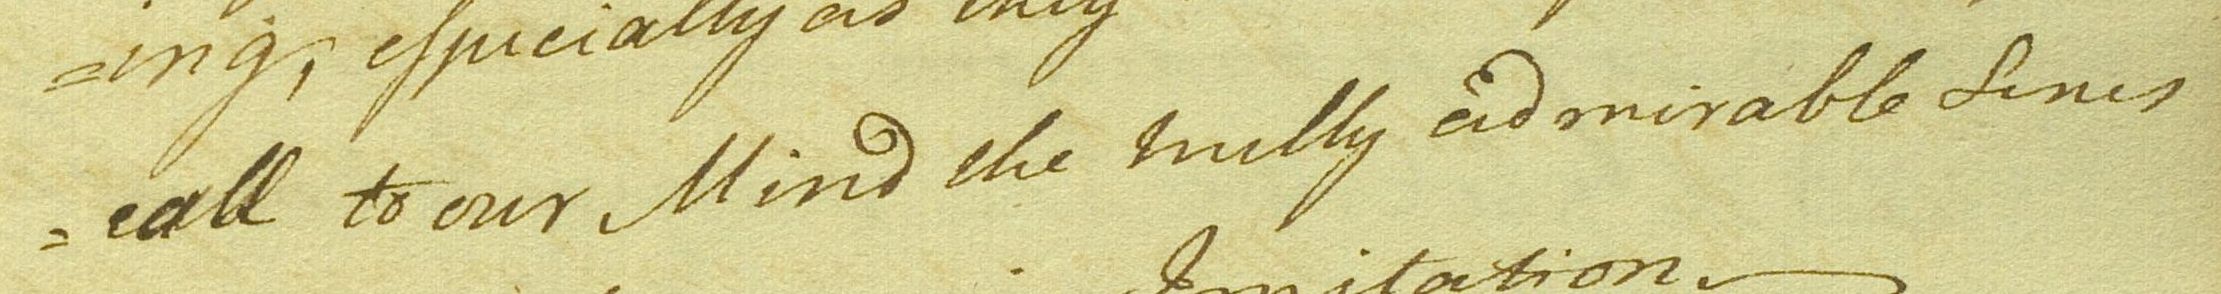-call to our Mind the trully admirable Lines
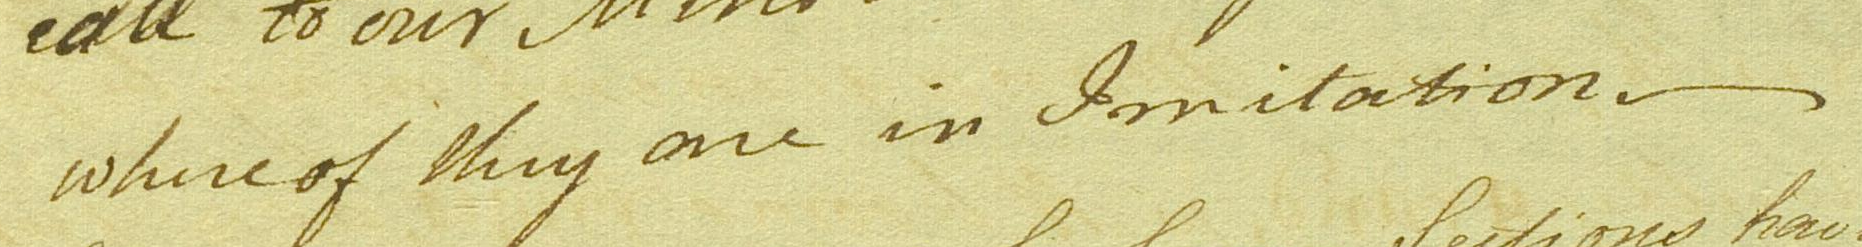whereof they are in Imitation-
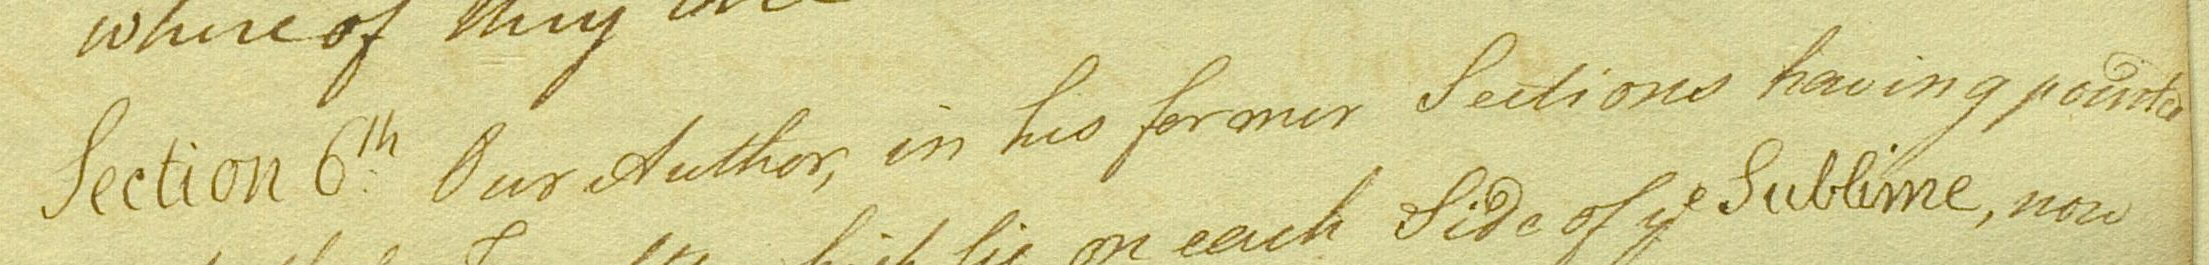Section 6^th Our Author, in his former Sections having pointed
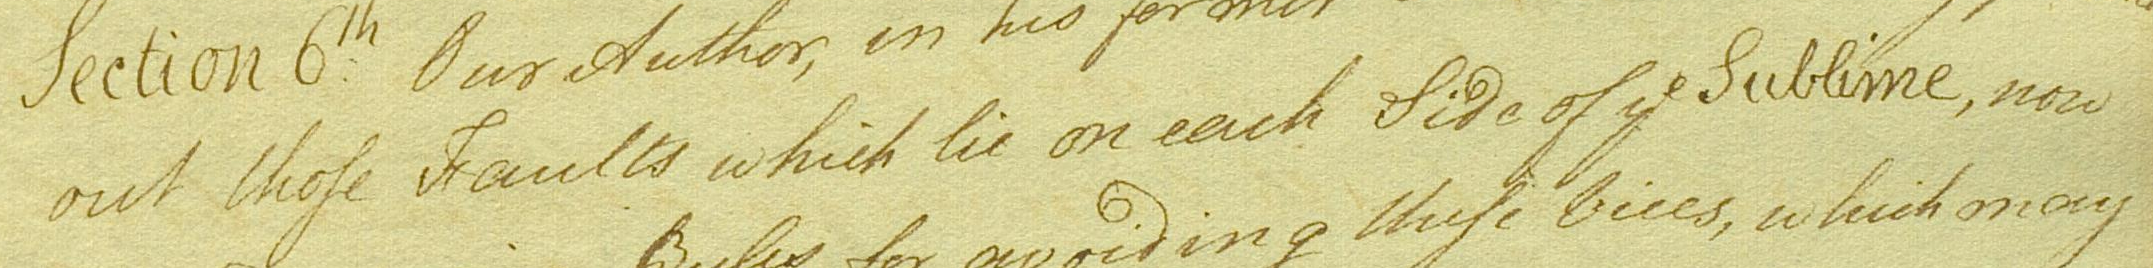out these Faults which lie on each Side of y^e Sublime, now
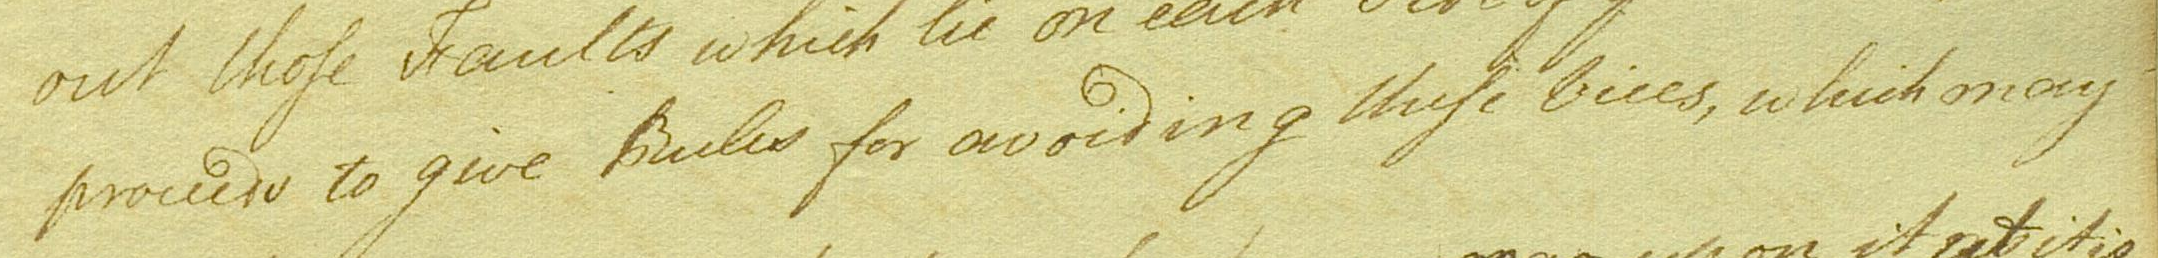proceeds to give Rules for avoiding these vices, which may
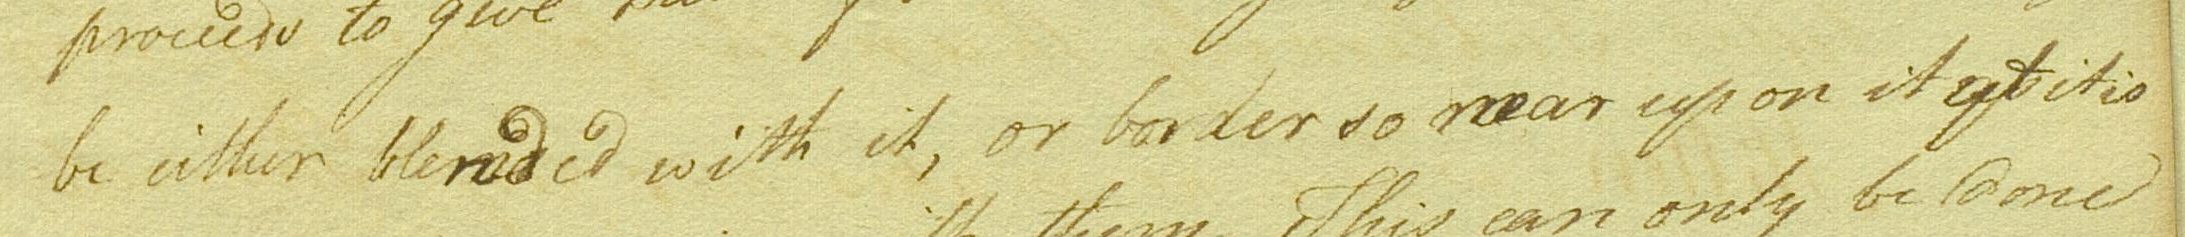be either blended with it, or border so near up on it y^t it is
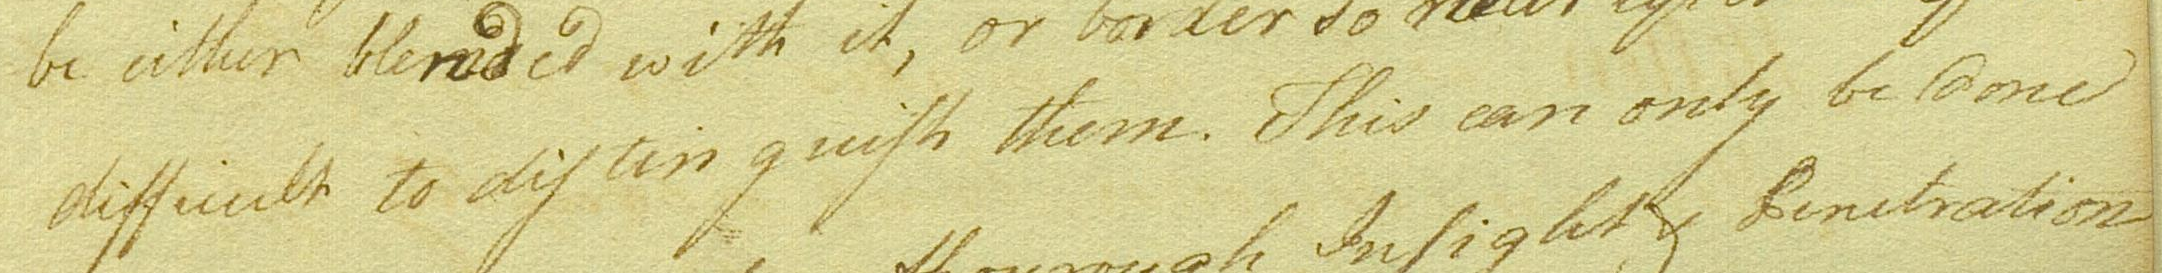difficult to distinguish them. This can only be done
